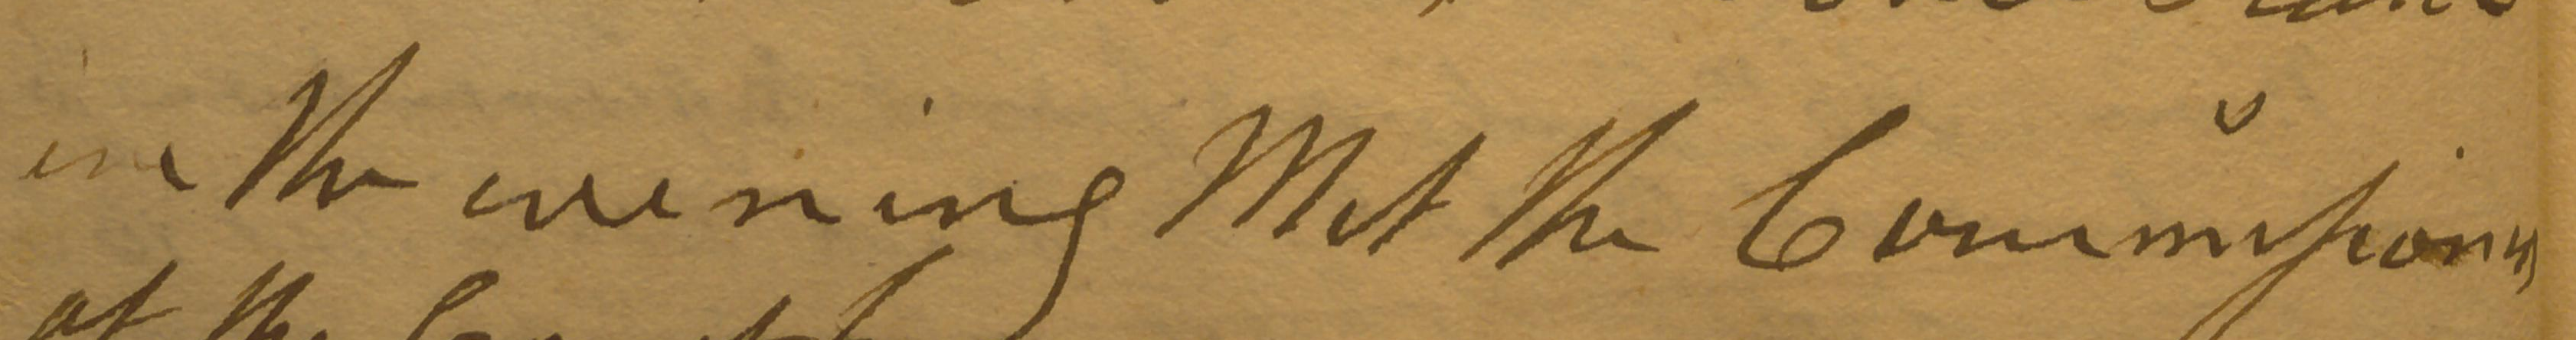the evening Met the Comrmisioners
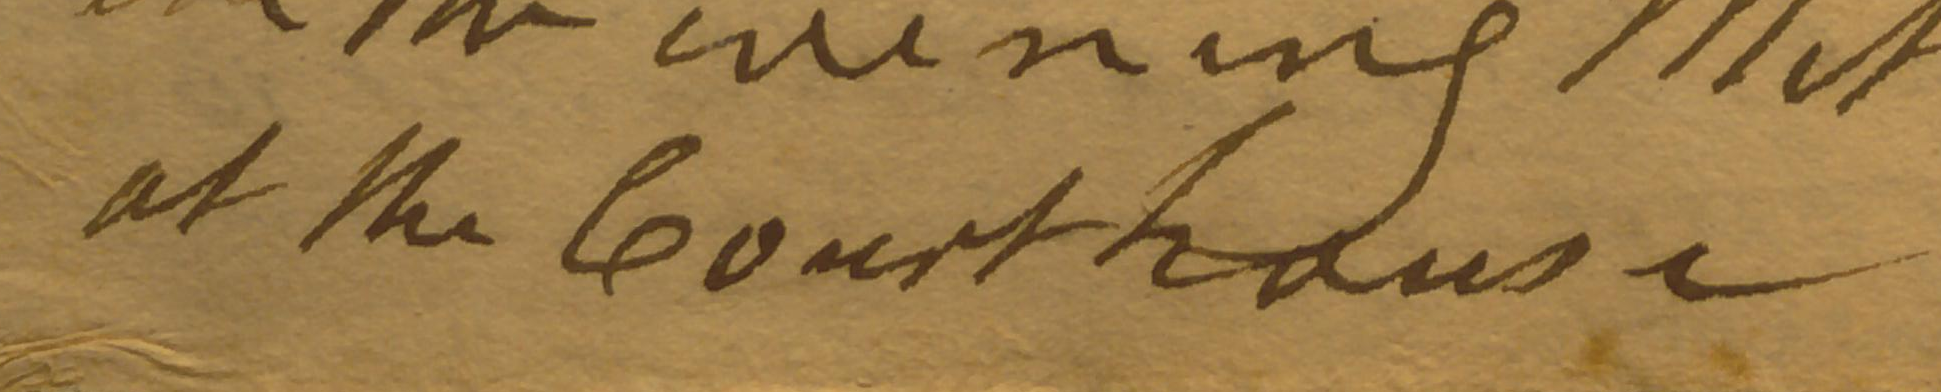at the Courthouse
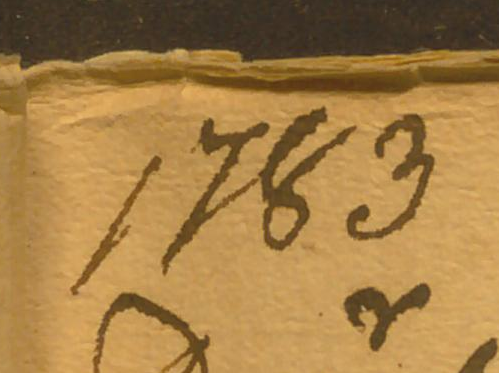1783
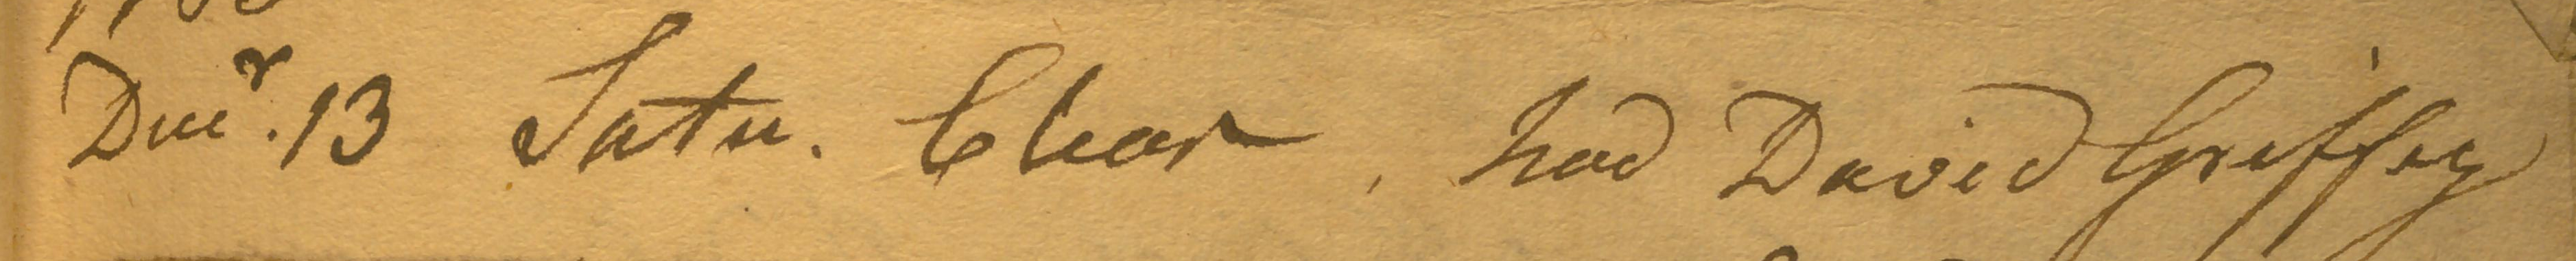Dece^r. 13 Satu. Clear had David Griffey
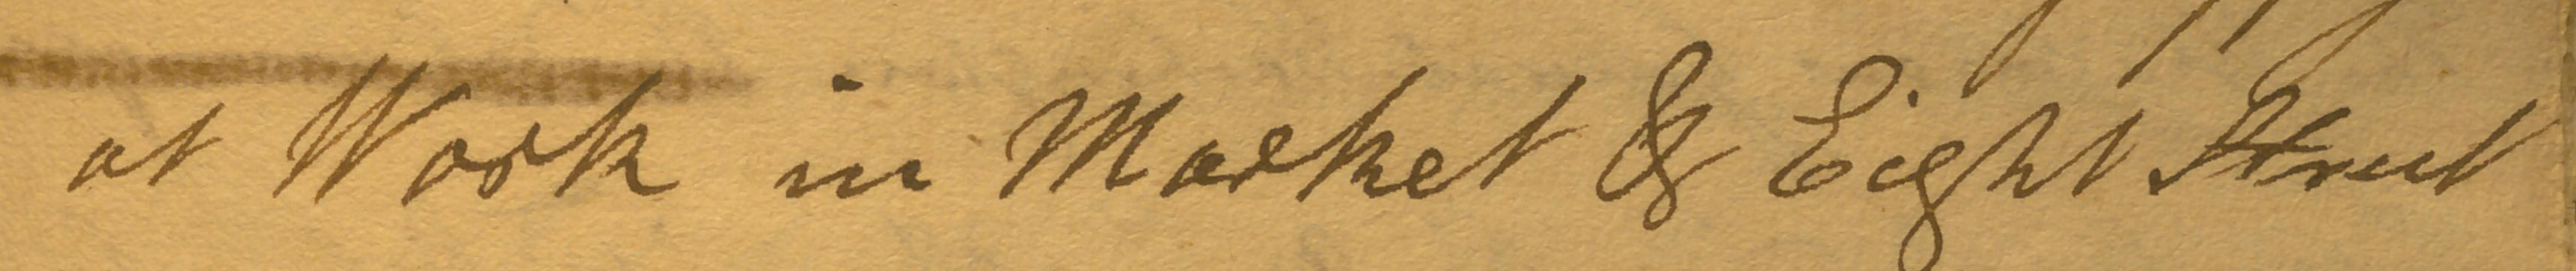at Work in Market & Eight Street
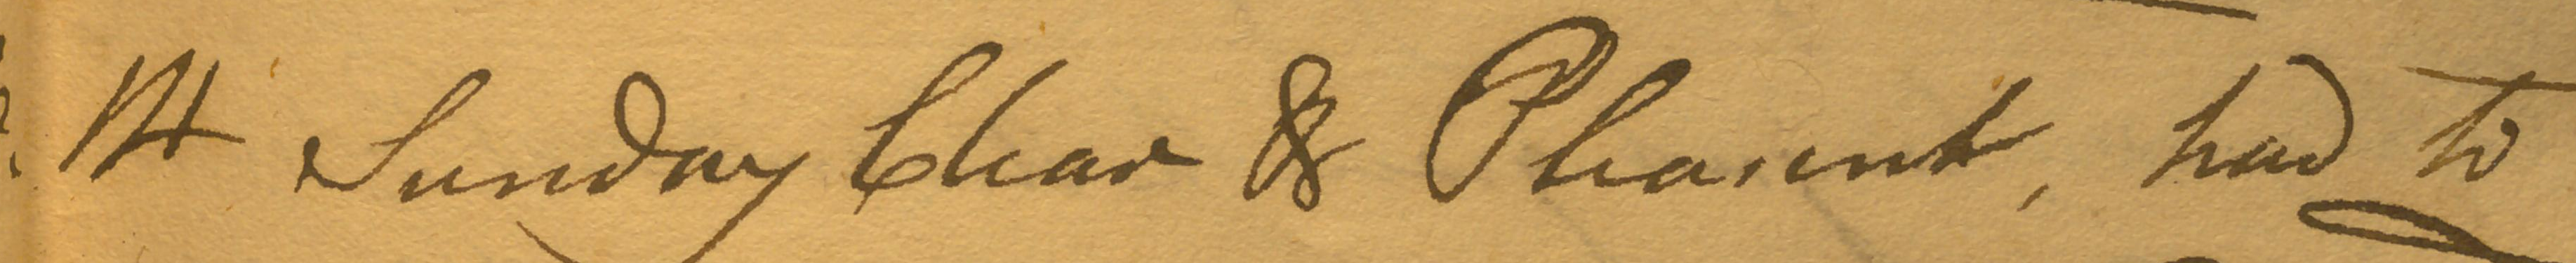14 Sunday Clear & Pleasent, had to
